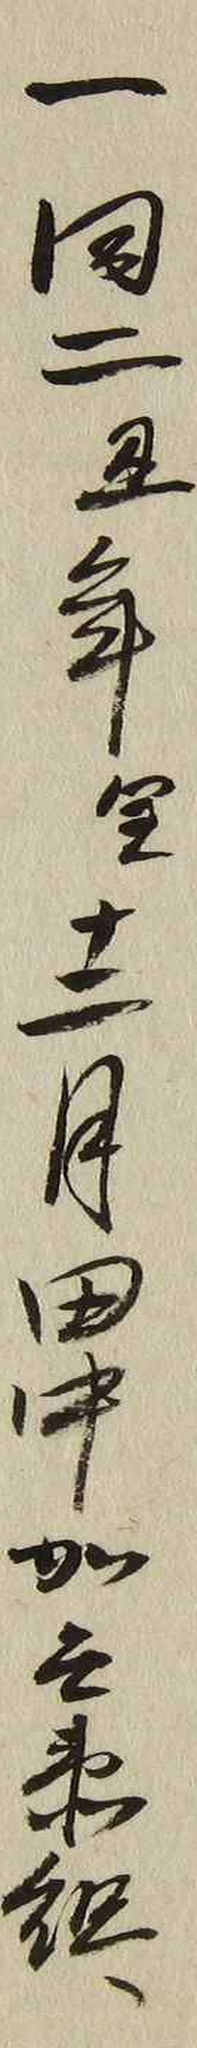一同二丑年閏十二月田中加兵衛組へ
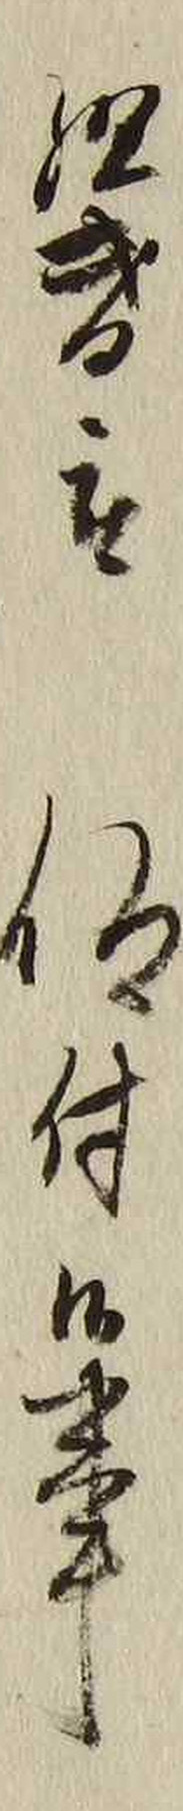組替被仰付候事
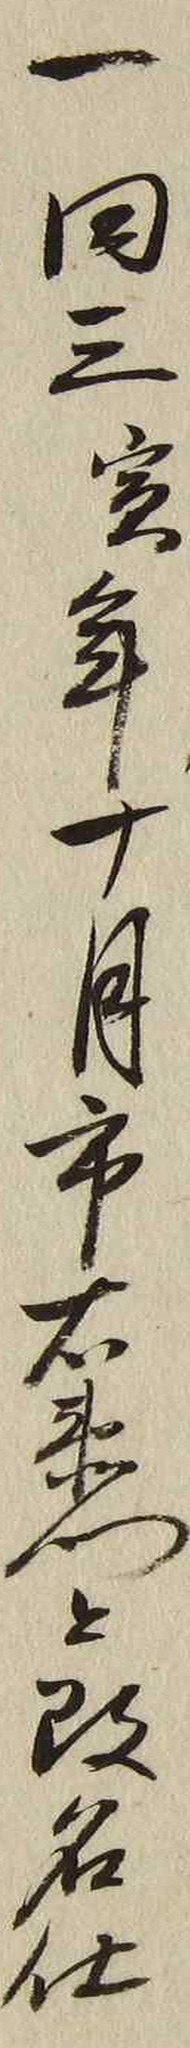一同三寅年十月市右衛門と改名仕
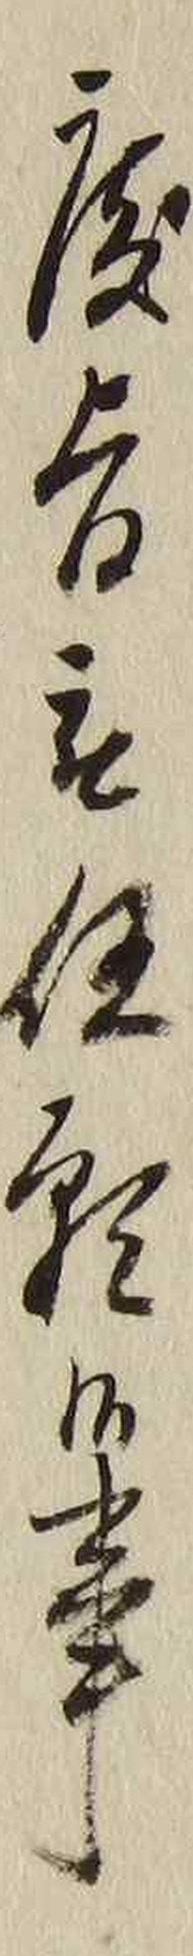度旨被任願候事
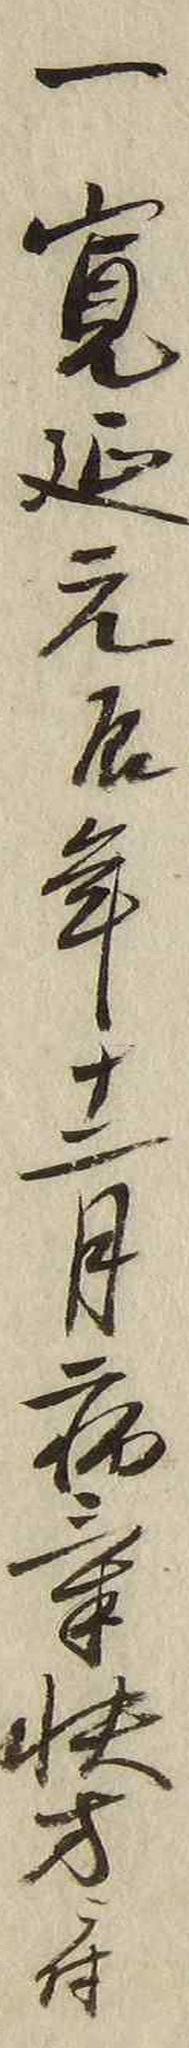一寛延元辰年十二月病気快方ニ付

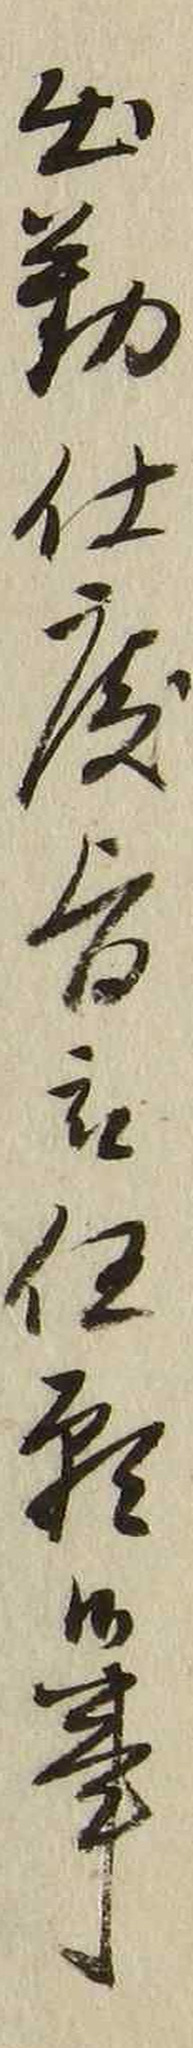出勤仕度旨被任願候事
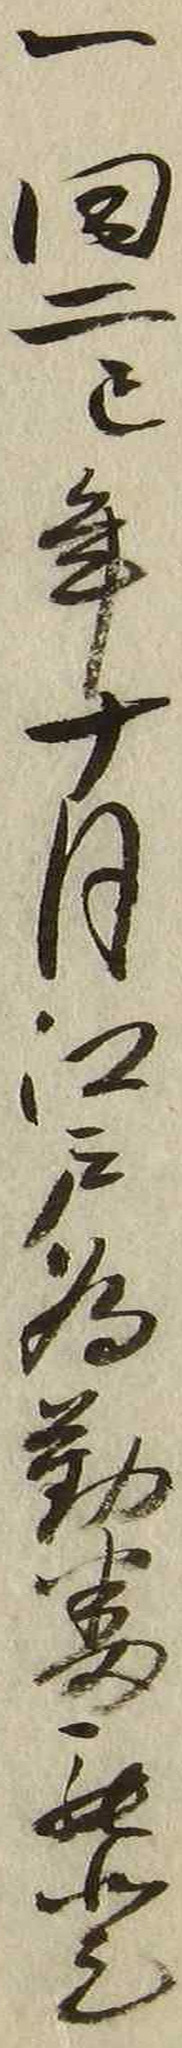一同二巳年十月江戸為勤番罷登
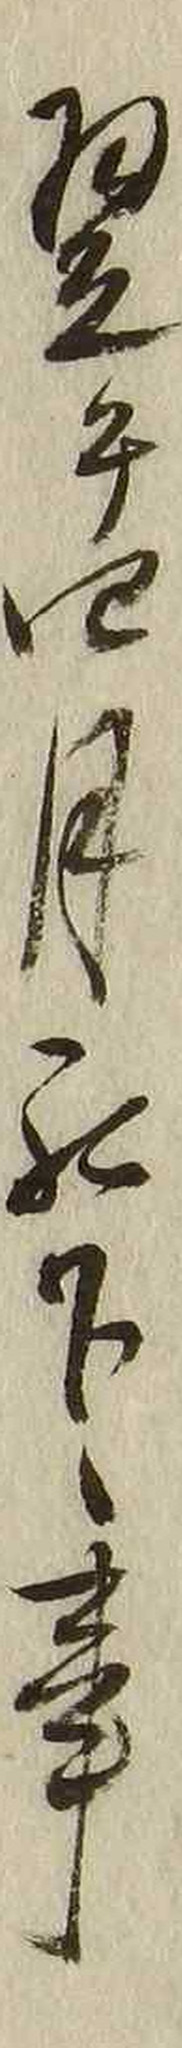翌午四月罷下候事
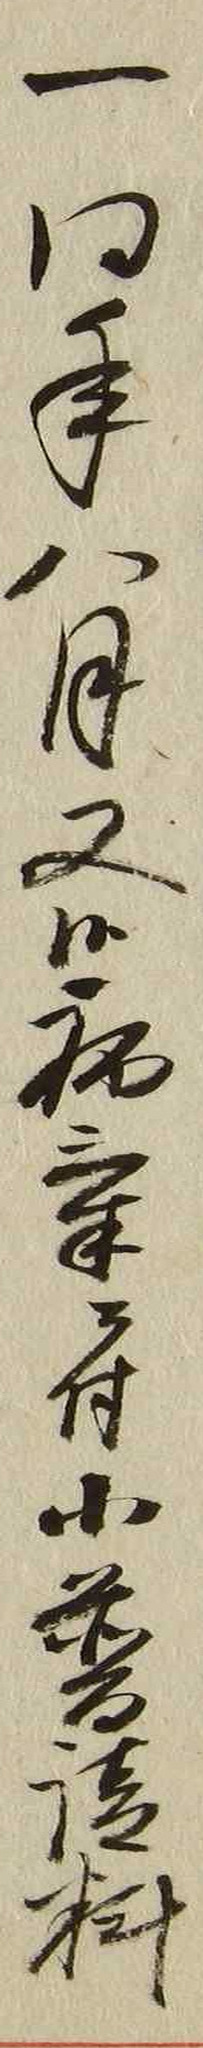一同年八月又候病気ニ付小普請料
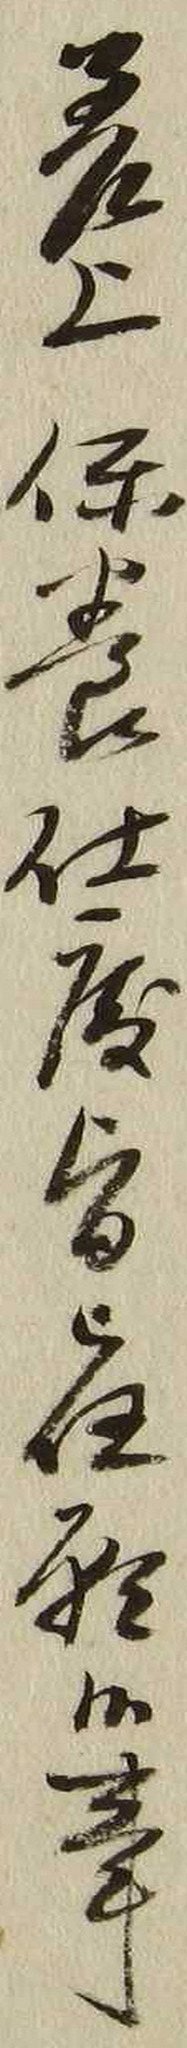差上保養仕度旨被任願候事
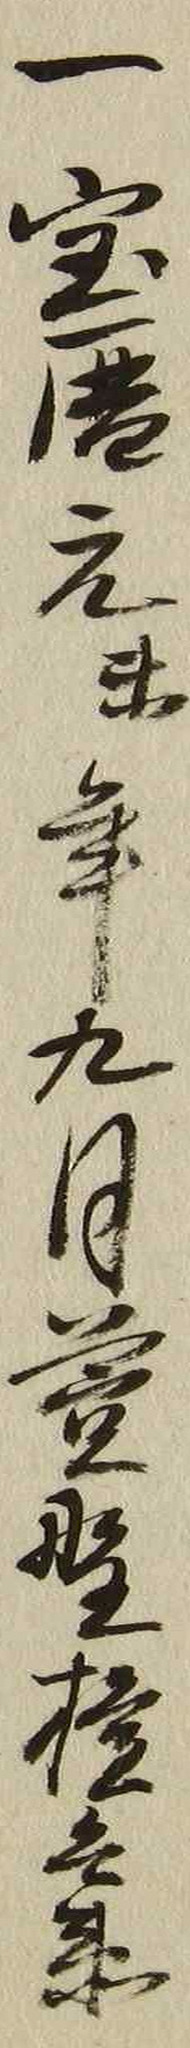一宝暦元未年九月萱野権兵衛
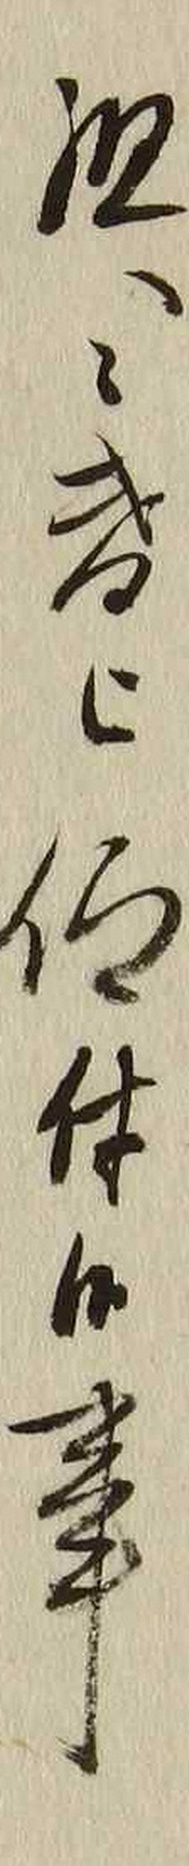組へ々替被仰付候御
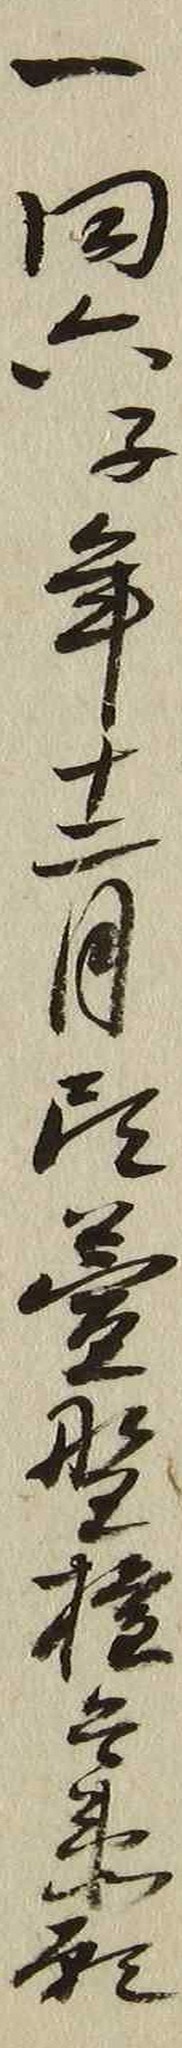一同六子年十二月頭萱野権兵衛願
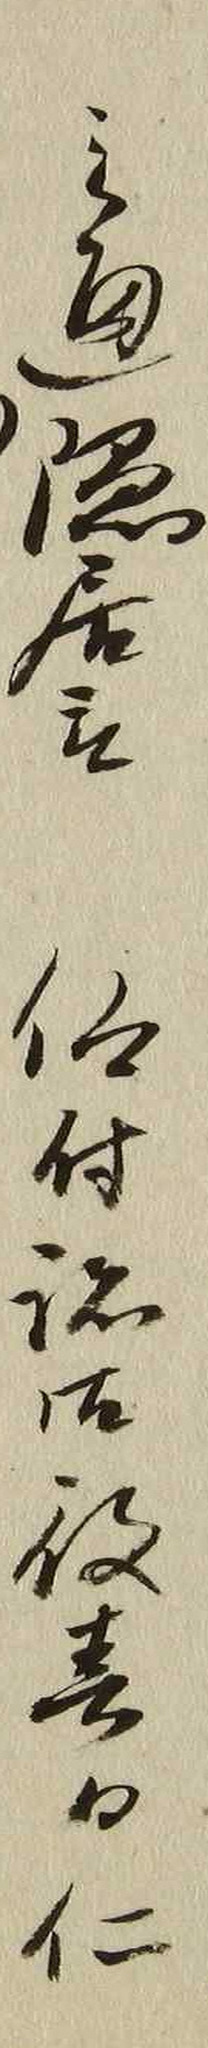之通隠居被仰付跡御役春日仁
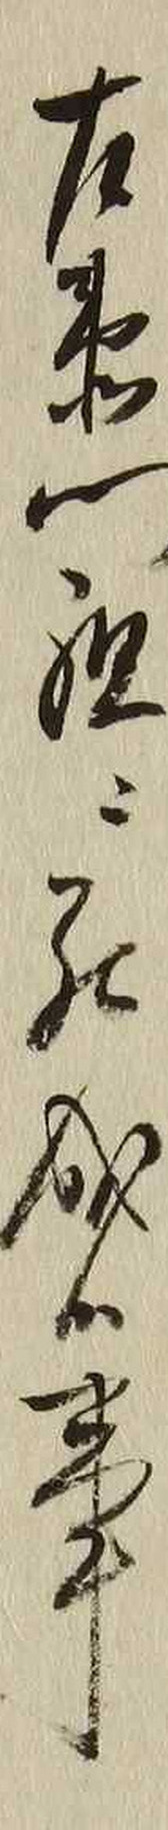左衛門組ニ罷成候事
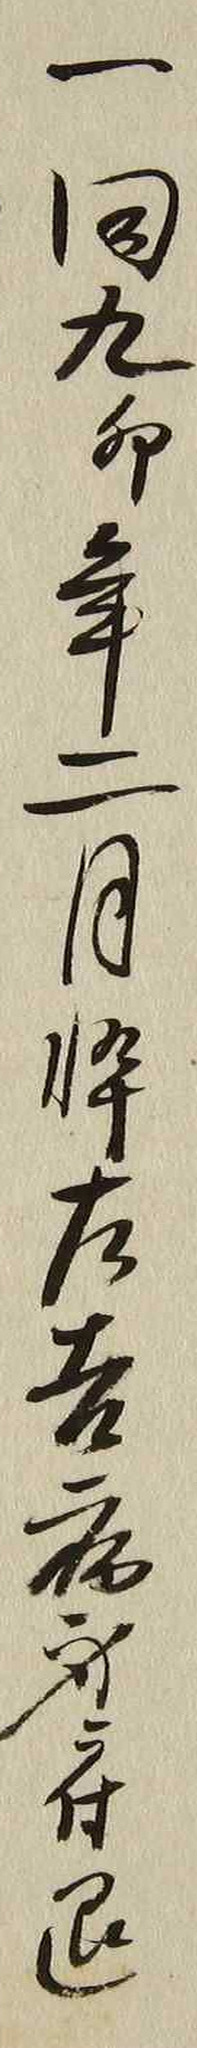一同九卯年二月忰左吉病身ニ付退
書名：諸士系譜　巻之355　す之部5
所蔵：会津若松市立会津図書館
